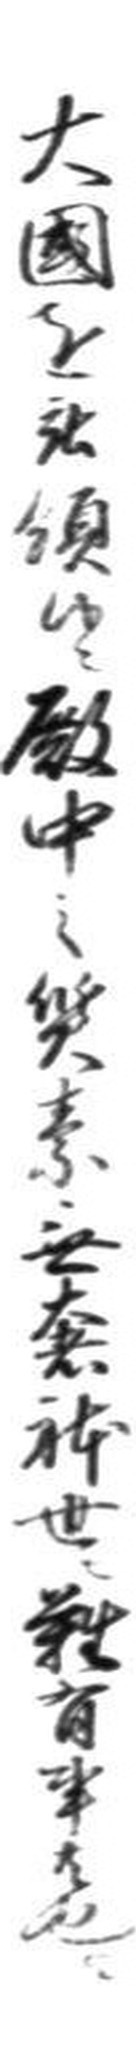大国を被領候ニ殿中之質素無奢体世二難有事共也と
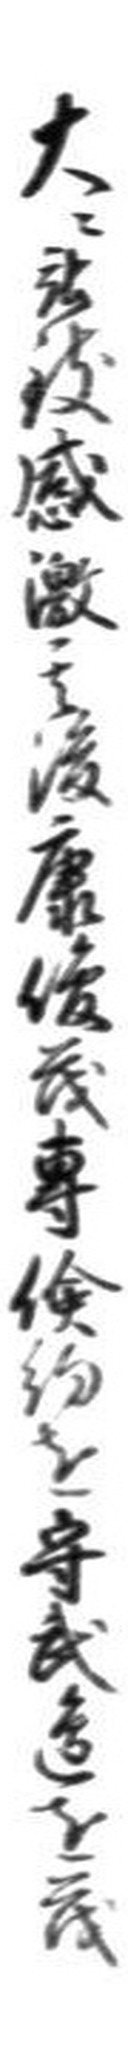大ニ被致感激其後康俊も専倹約を守武辺をも
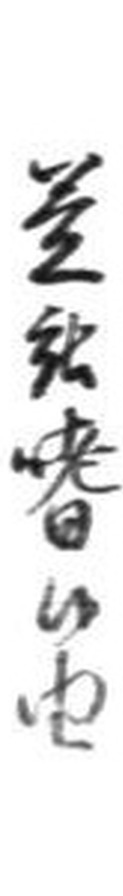益被嗜候由
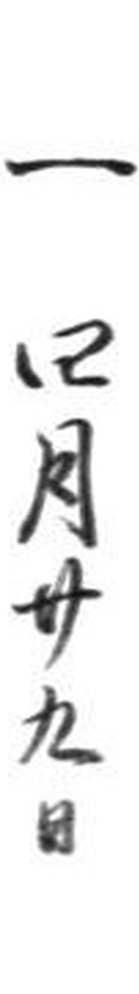一四月廿九日
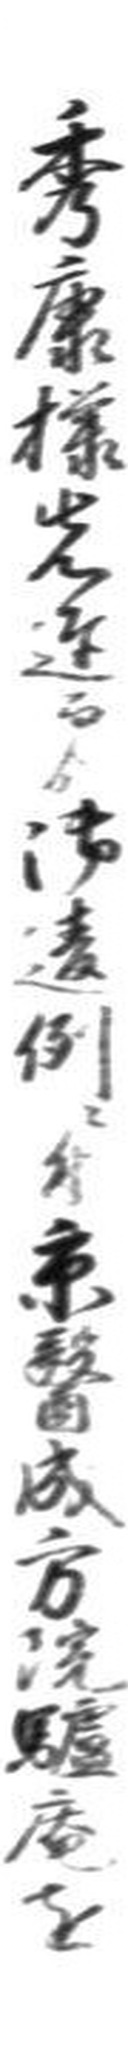秀康様先達而ゟ御違例ニ付京医成方院驢庵を
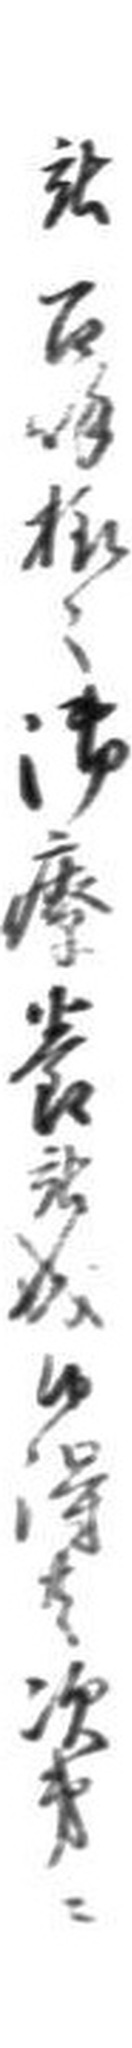被召呼様々御療養被成候得共次第ニ
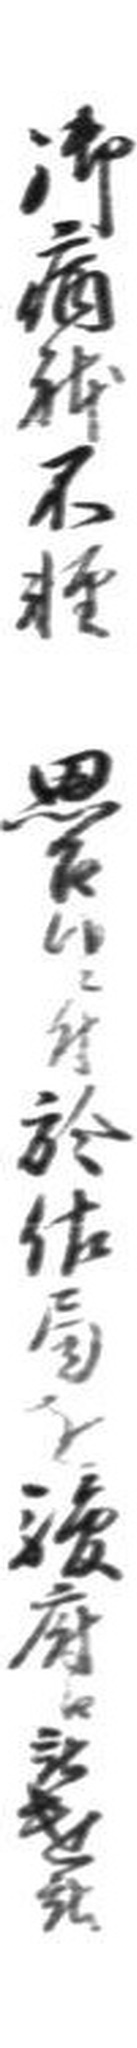御病体不軽思召候ニ付於佐局を駿府江被遣被
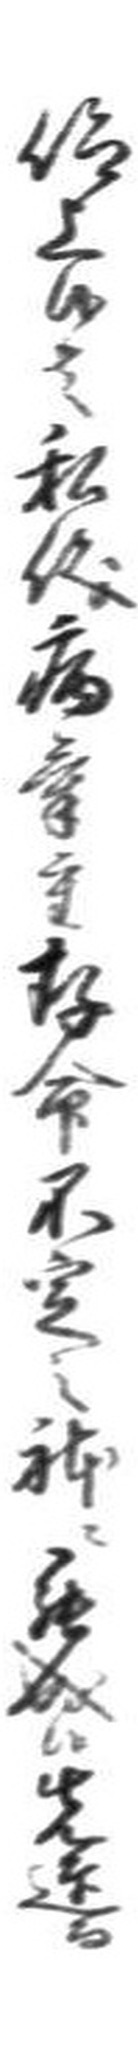仰上候者私儀病気重存命不定之体ニ罷成候先達而
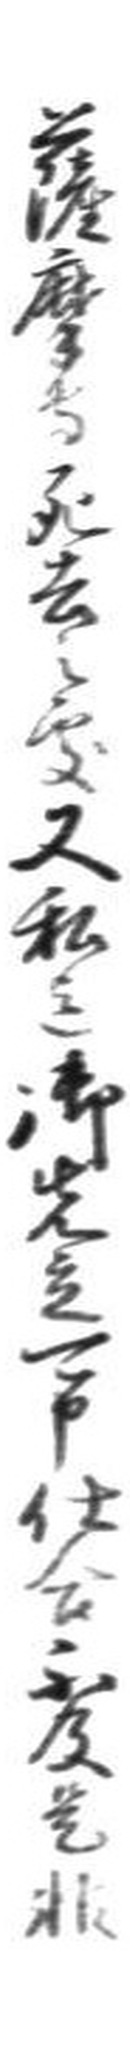薩摩守死去之処又私迄御先立可申仕合不及是非
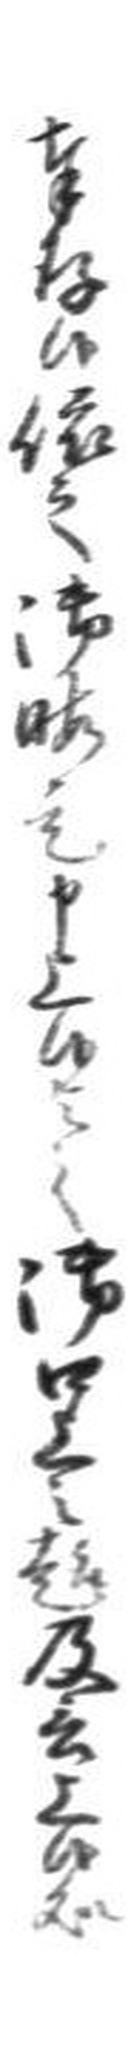奉存候依之御暇乞申上候と之御口上之趣及言上候処
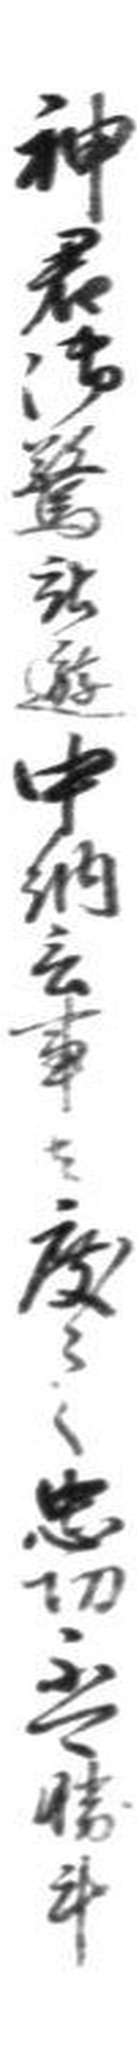神君御驚被遊中納言事は度々之忠功不可勝計

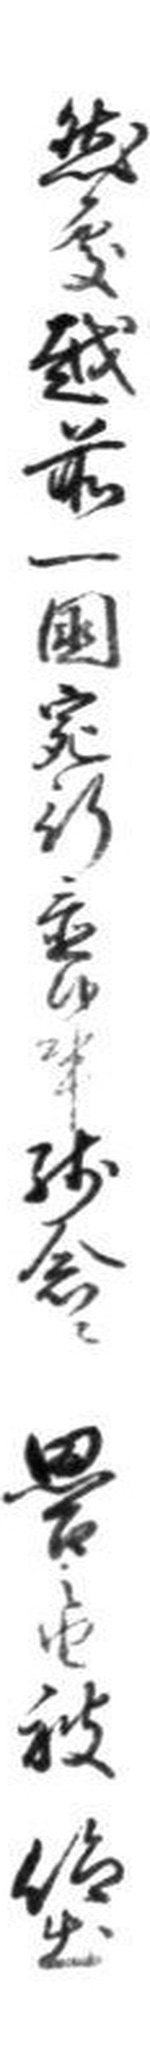然処越前一国宛行置候事残念ニ思召之由被仰出
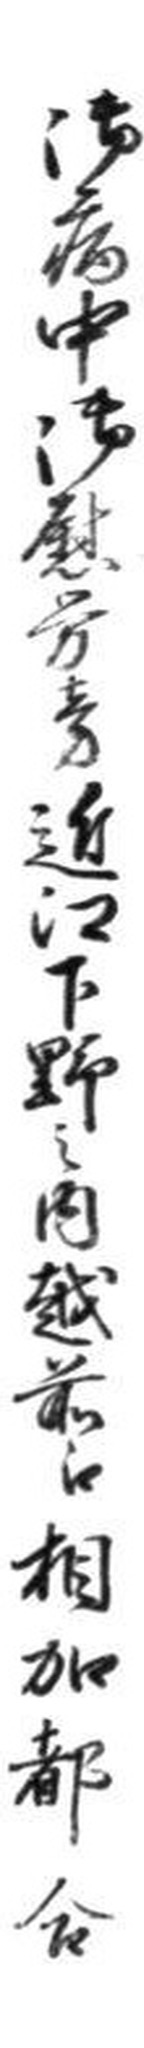御病中御慰労旁近江下野之内越前江相加都合
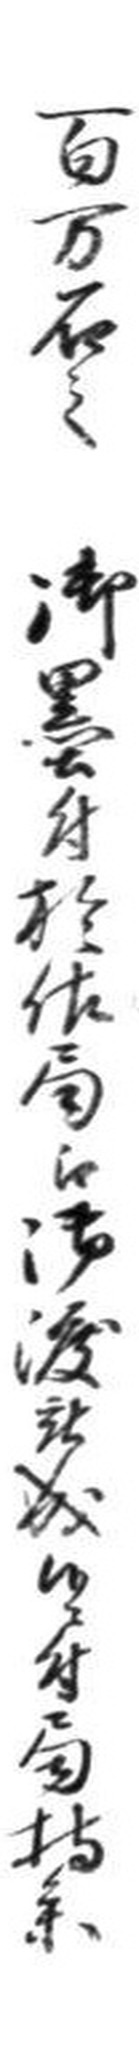百万石之御墨付於佐局江御渡被成候ニ付局持参
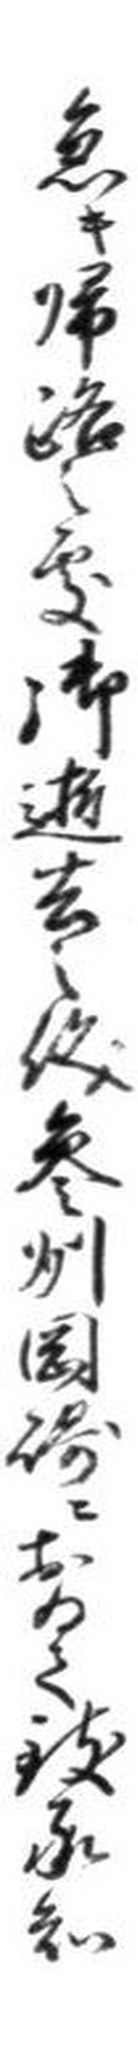急キ帰路之処御逝去之儀参州岡崎ニおゐて致承知
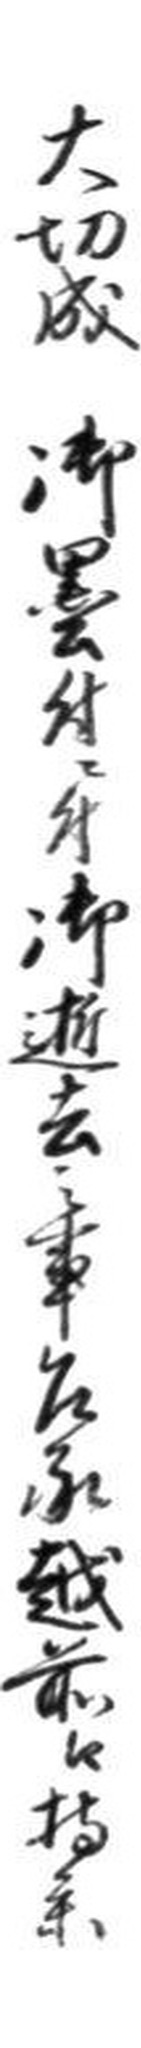大切成御墨付ニ付御逝去之事乍承越前江持参
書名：家譜 一 秀康公 従天正二年到慶長十二年
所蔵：福井県文書館 Fukui Prefectural Archives
